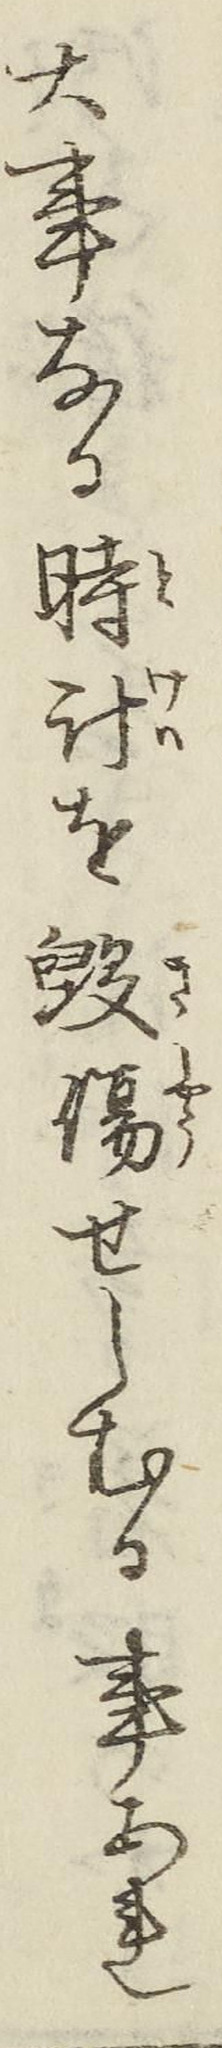大事なる時計を毀傷せしむる事あれ
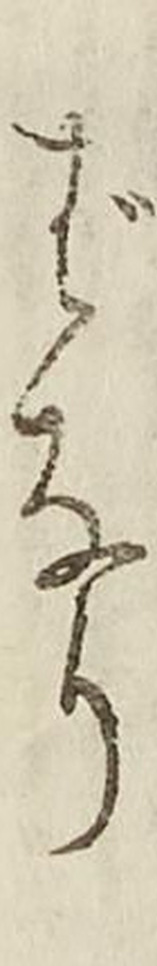ばなり
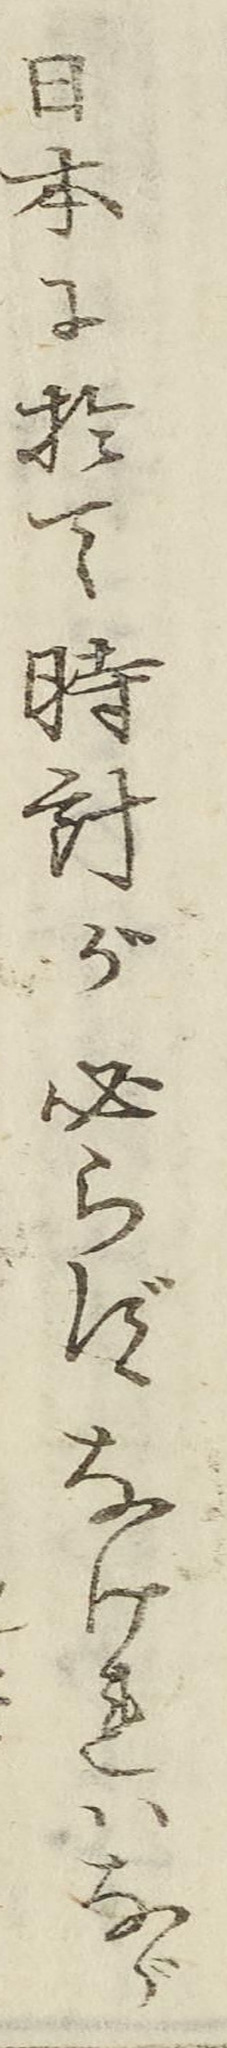日本に於て時計が必らずなけれはなら
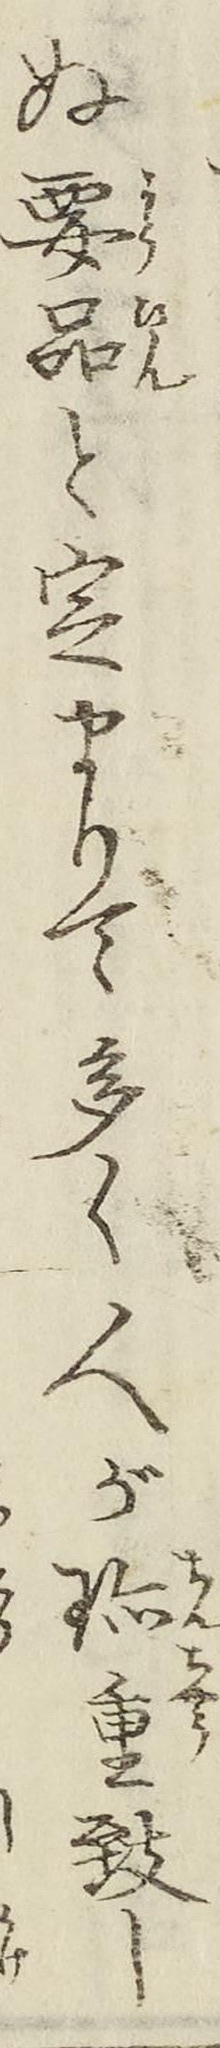ぬ要品と定まりて多く人が珍重致し
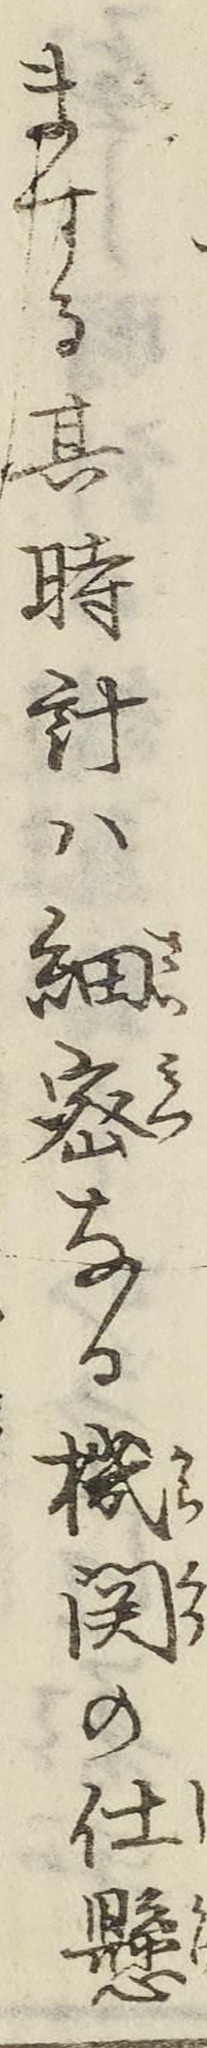まする其時計は細密なる機関の仕懸
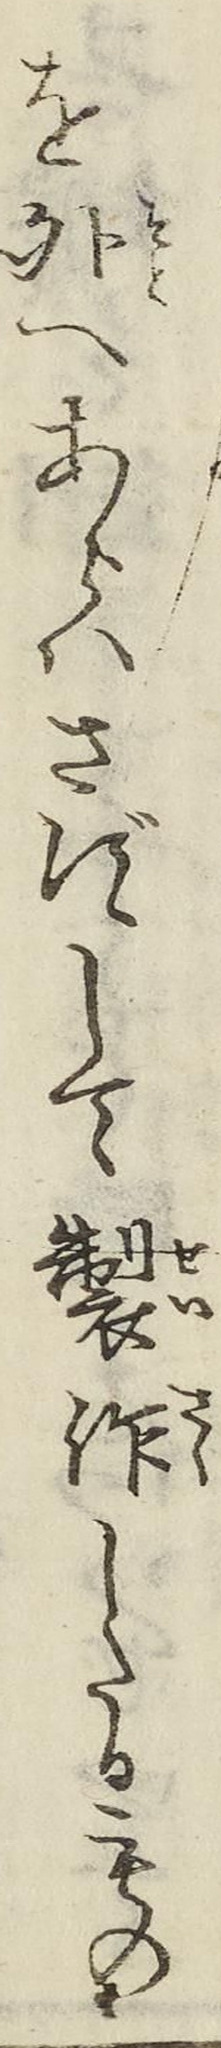を外へあらはさずして製作したるもの
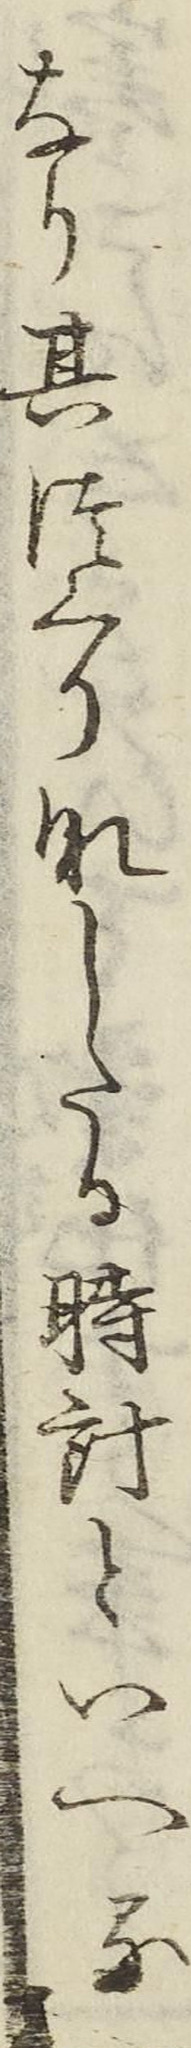なり其つくりなしたる時計といへる
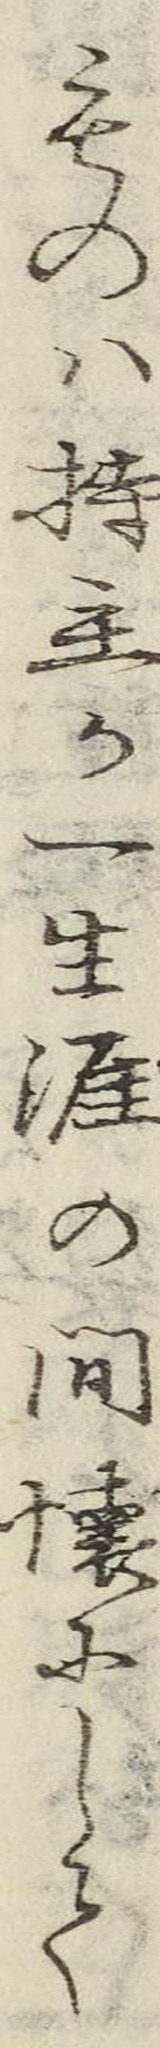ものは持主か一生涯の間懐にして
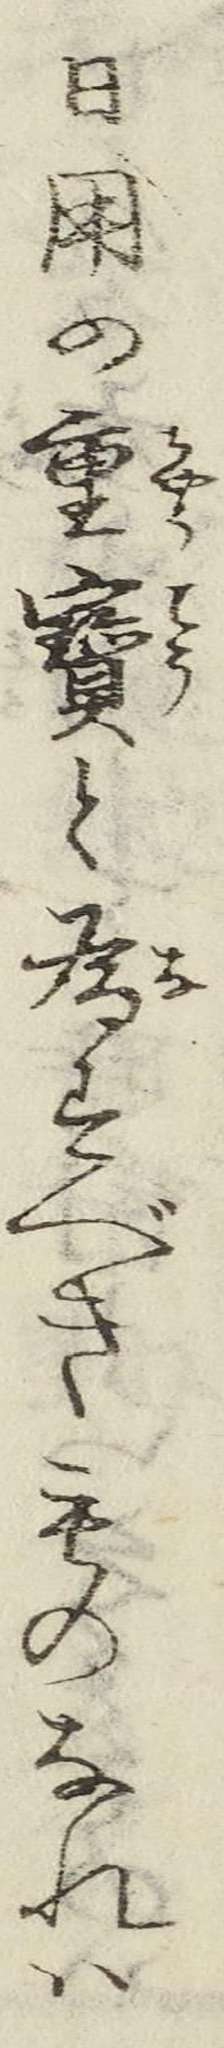日用の重宝と為すべきものなれは
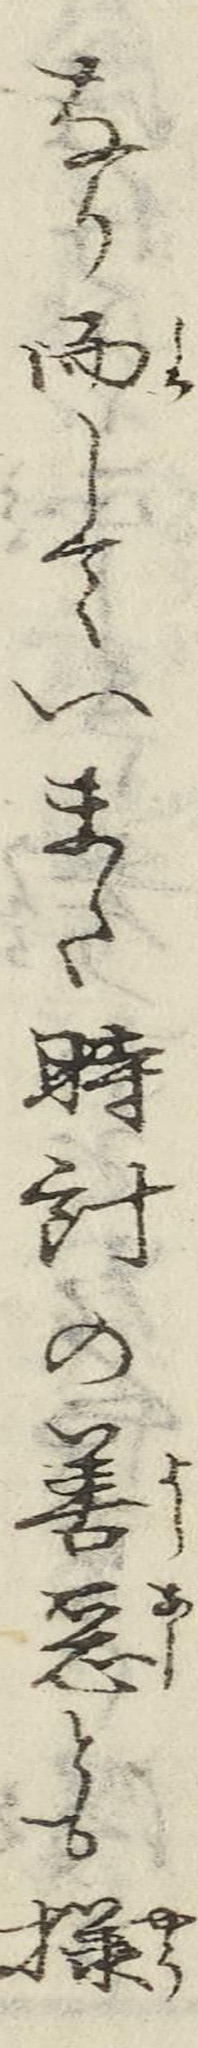なり而していまた時計の善悪とも様
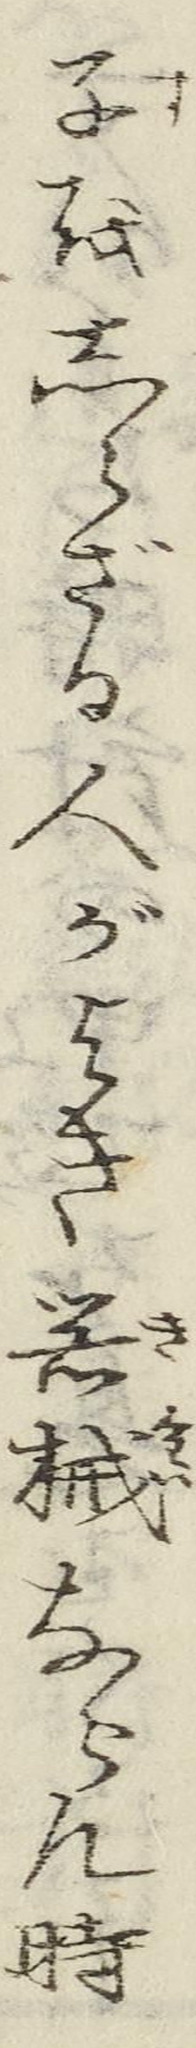子をしらざる人がよき器械ならん時
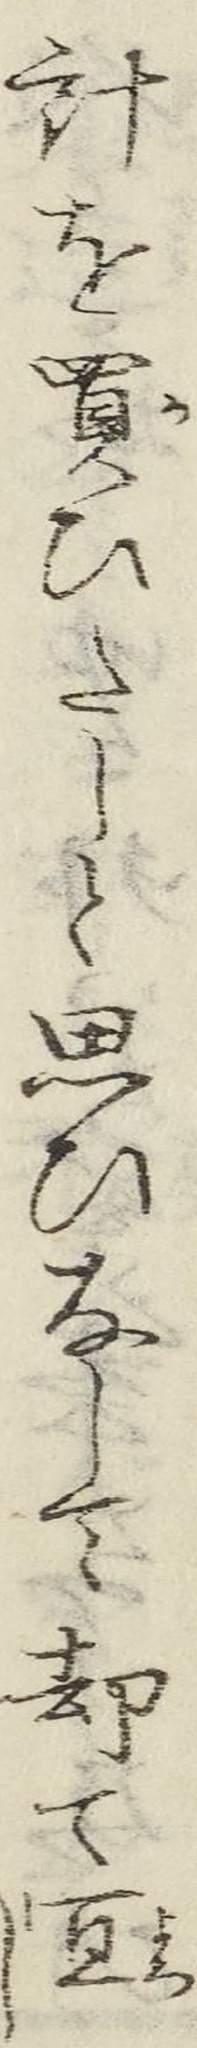計を買ひたしと思ひなして却て宜し
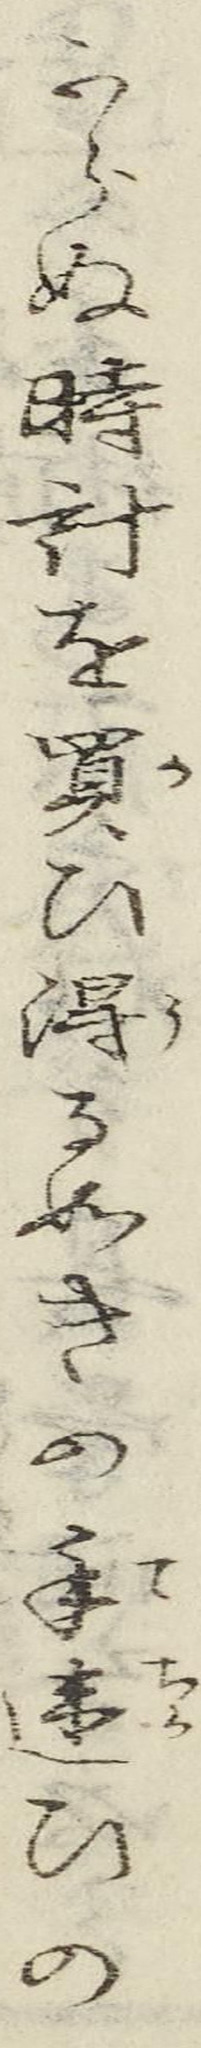からぬ時計を買ひ得る如きの手違ひの
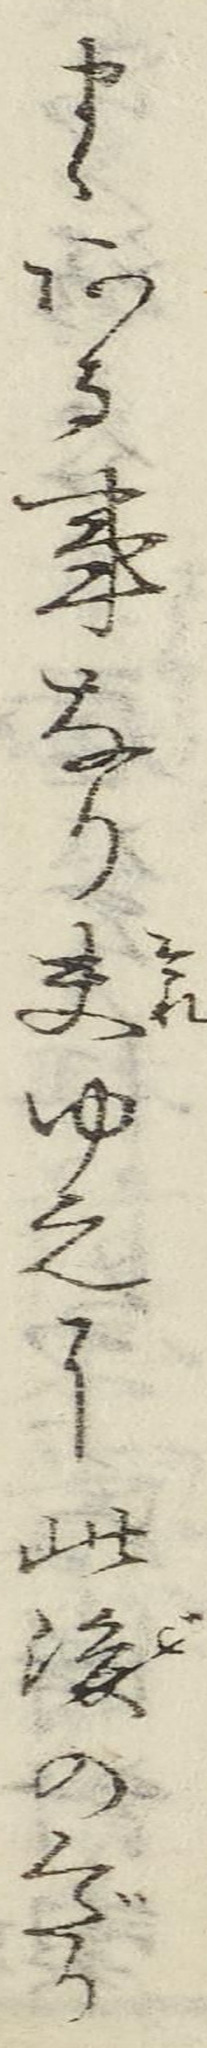まゝある事なり夫ゆえに此後のくだり
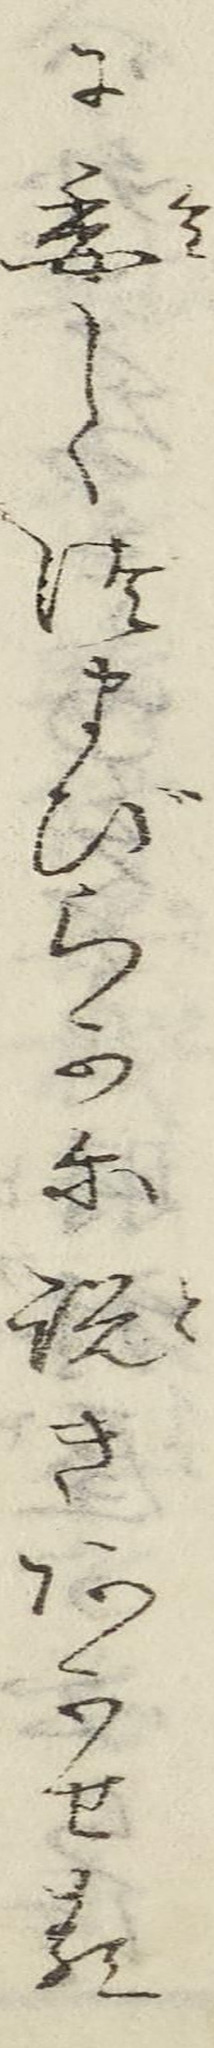に委しくつまびらかに説きあかせる
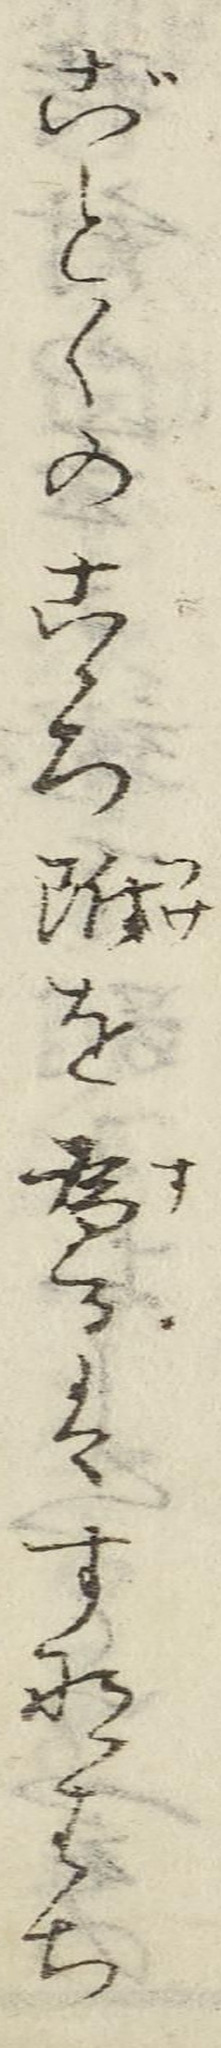ごとくのこゝろ附を為るはすなはち
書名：[時計に関する冊子]
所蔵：東京大学地震研究所図書室 Earthquake Research Institute Library, The University of Tokyo, JAPAN
